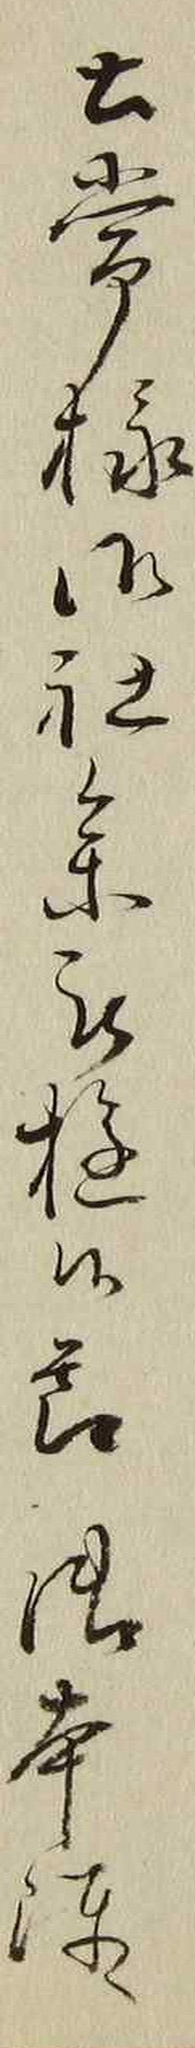土常様御社参被遊候節御本陣へ
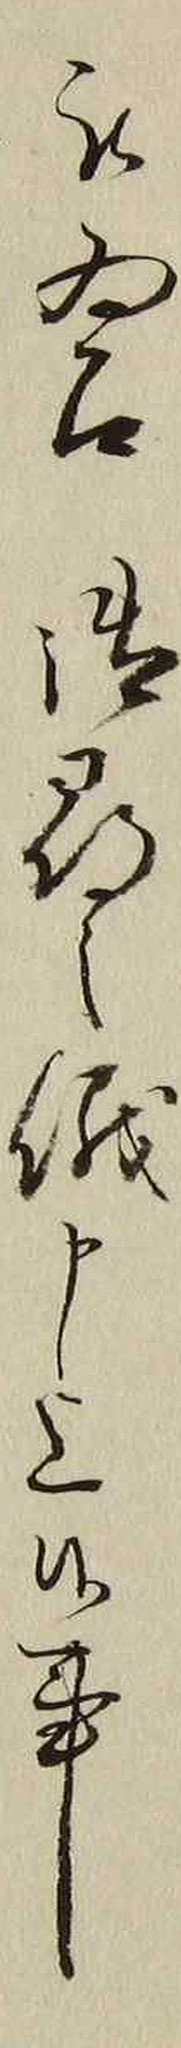被為召御尋の儀申上候事
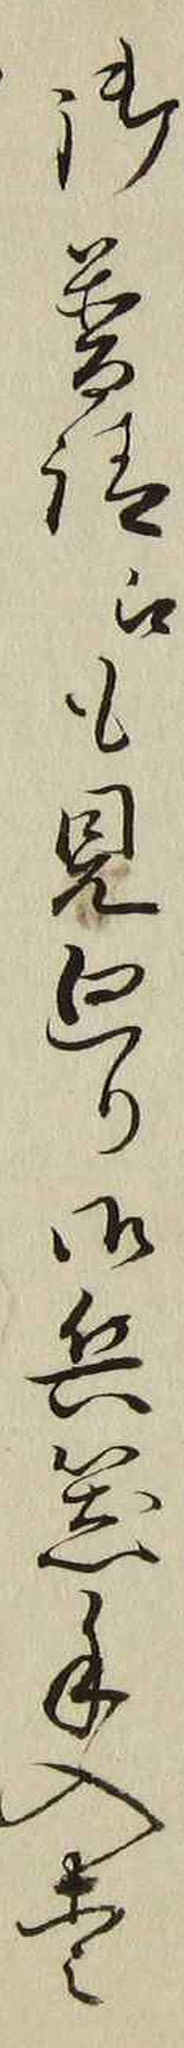御普請江も見廻り御兵器手入等の
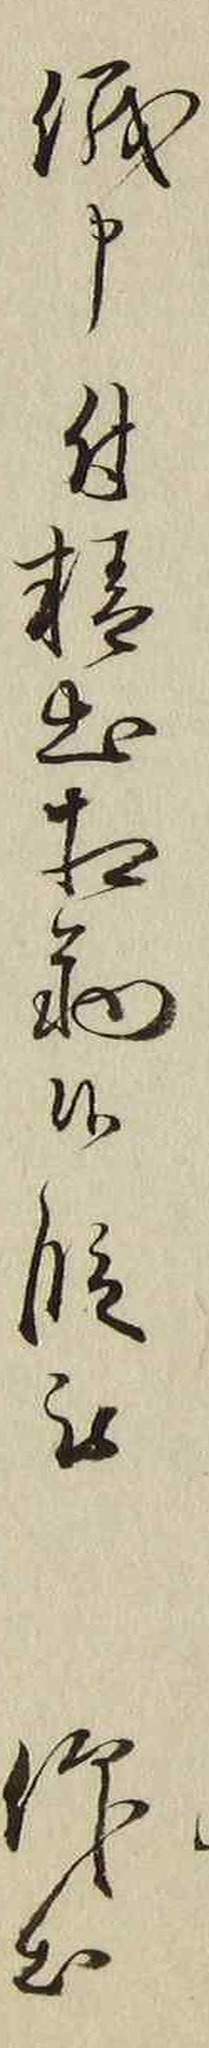儀申付精出相勤候段被仰出

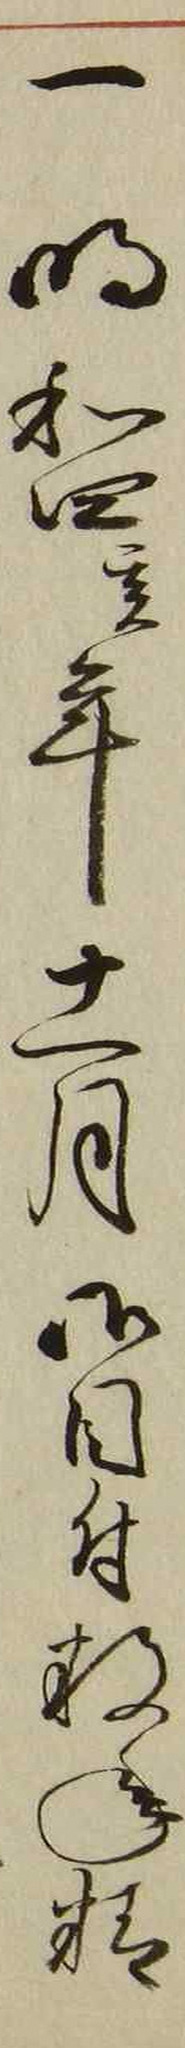一明和四亥年十一月御目付数年精
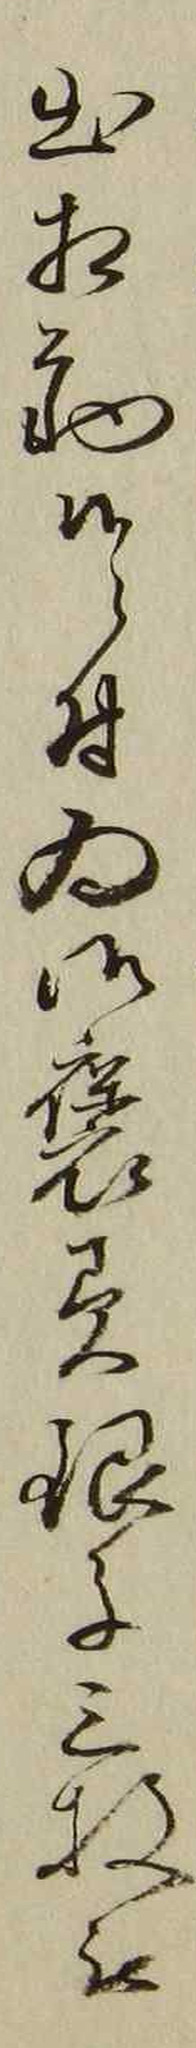出相勤候に付為御褒美銀子三枚被
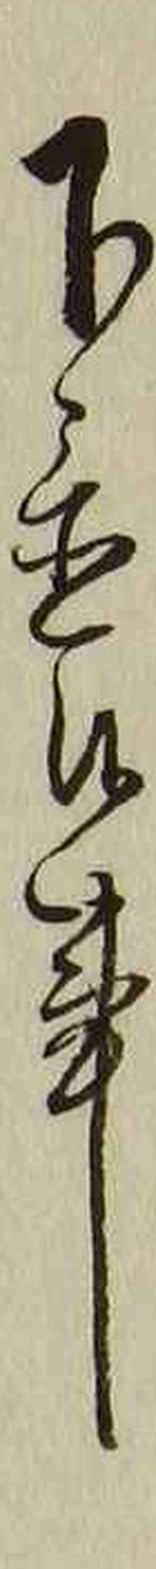下置候事
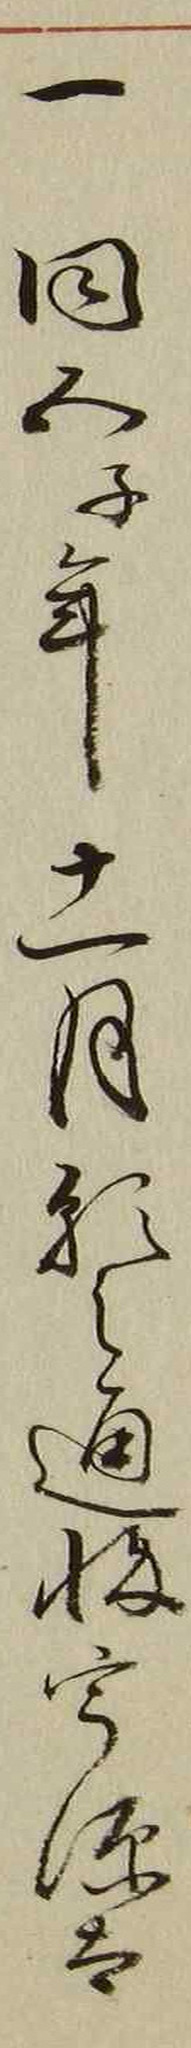一同五子年十一月願の通忰宇源太
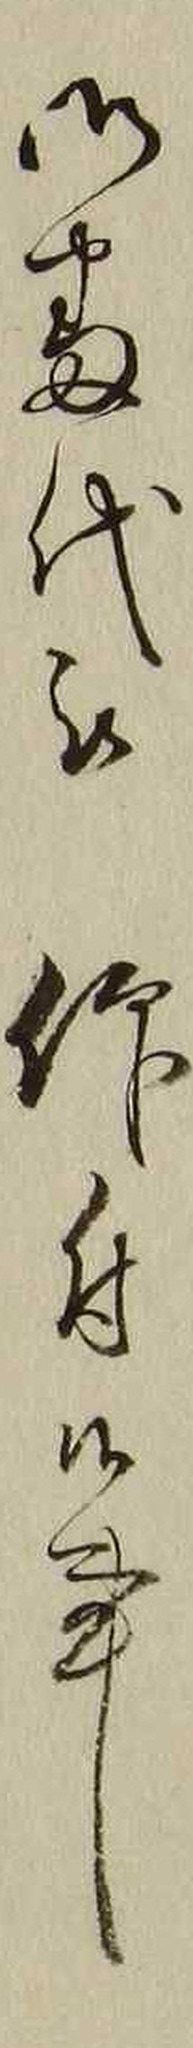御番代被仰付候事
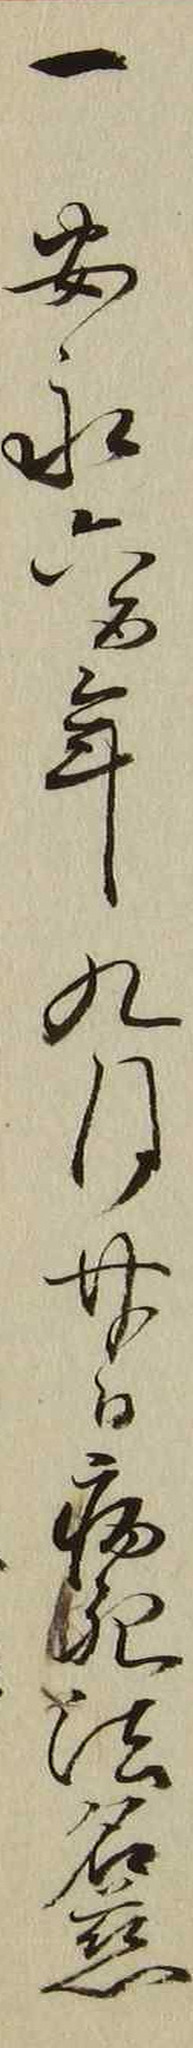一安永六酉年九月廿日病死法名慈
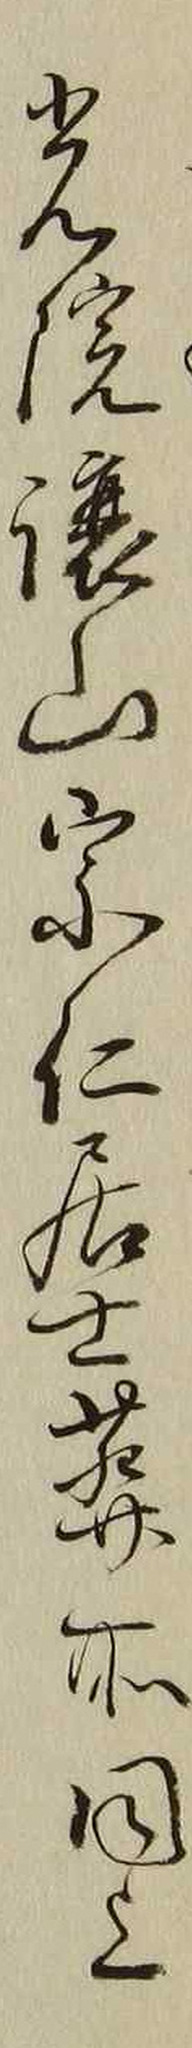光院譲山宗仁居士葬所同上
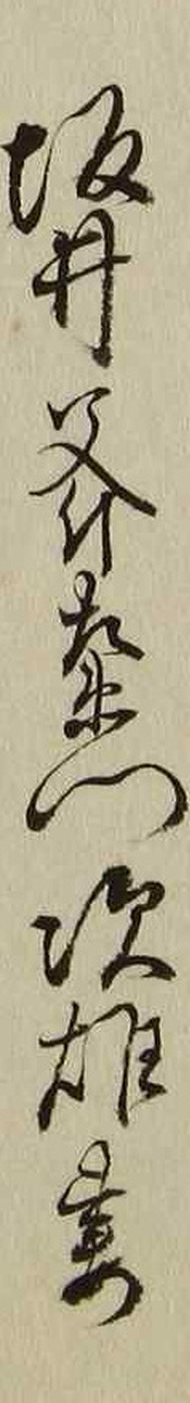女坂井斧左衛門次雄妻
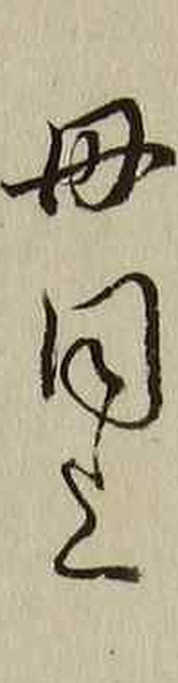母同上
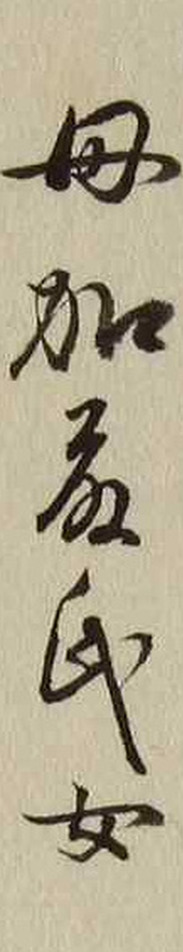母加藤氏女
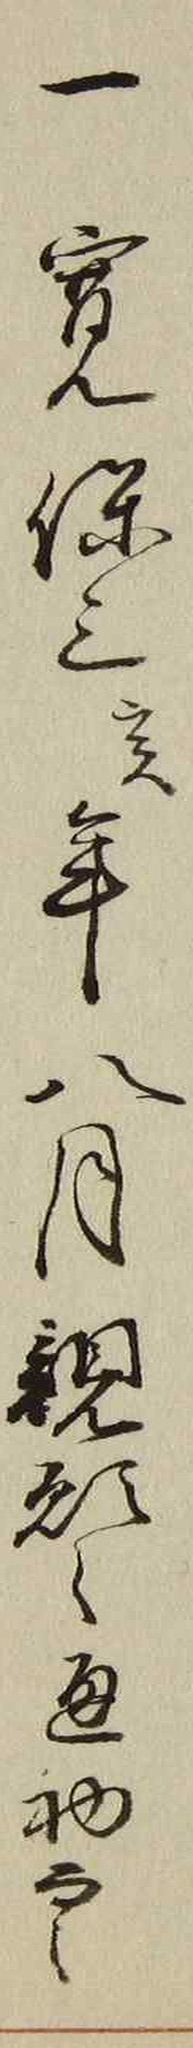一寛保三亥年八月親願の通初而の
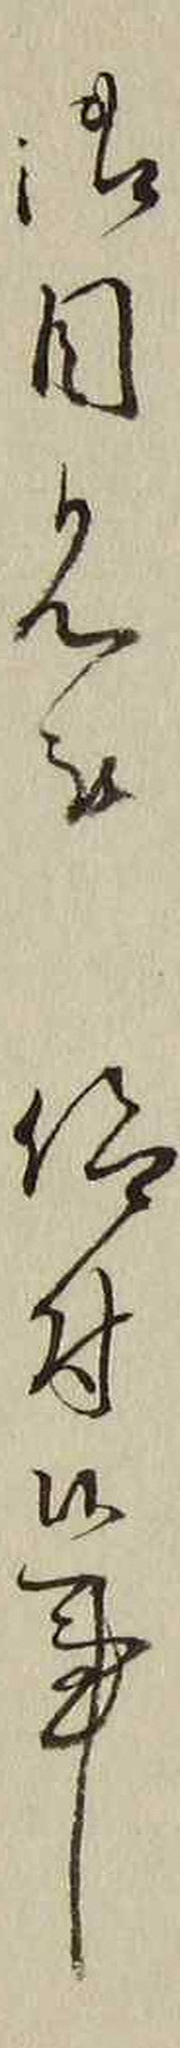御目見被仰付候事
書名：諸士系譜　巻之1　い之部1
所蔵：会津若松市立会津図書館
